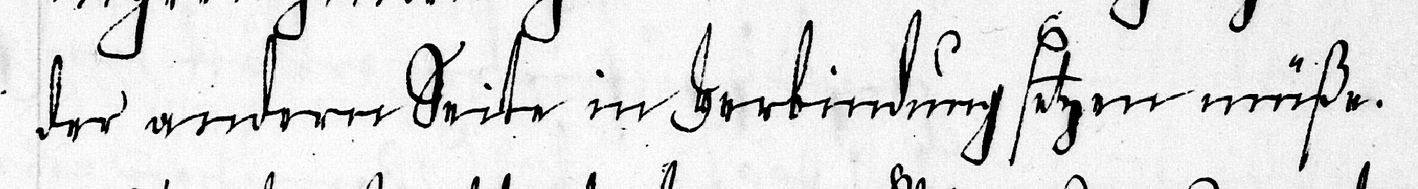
der andern Seite in Verbindung setzen müße.
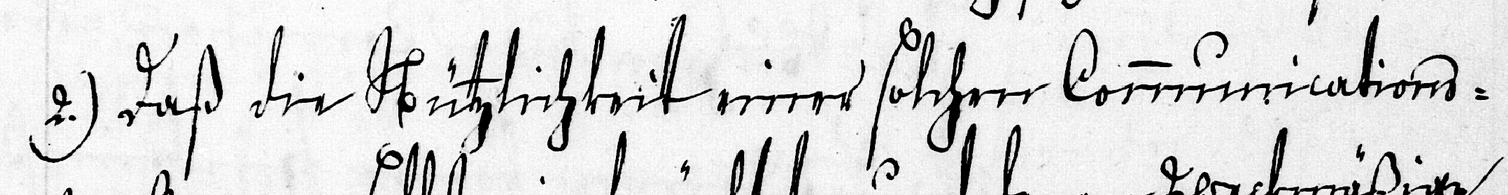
2.) Daß die Nützlichkeit einer solchen Communications¬
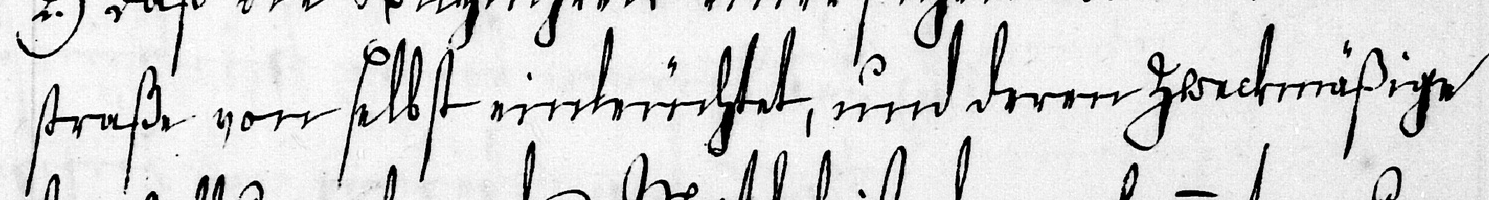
straße von selbst einleuchtet, und deren zweckmäßige
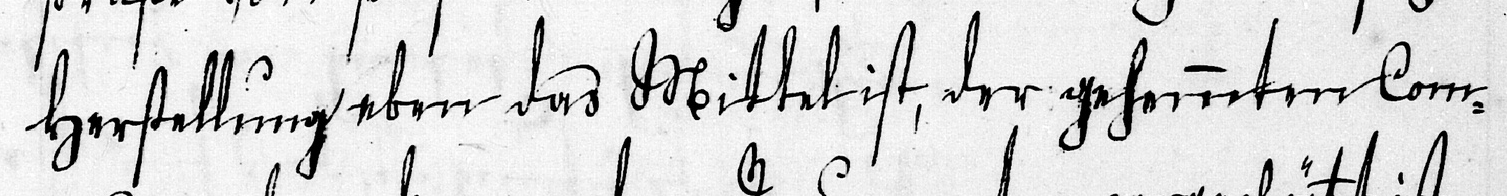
Herstellung eben das Mittel ist, der gehemmten Com¬
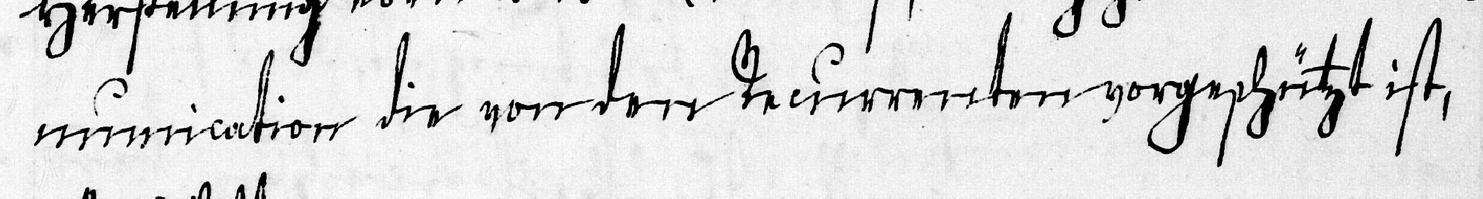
munication die von den Recurrenten vorgeschützt ist,
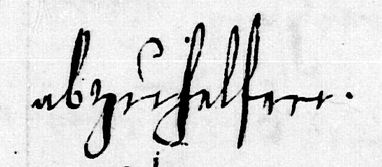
abzuhalten.
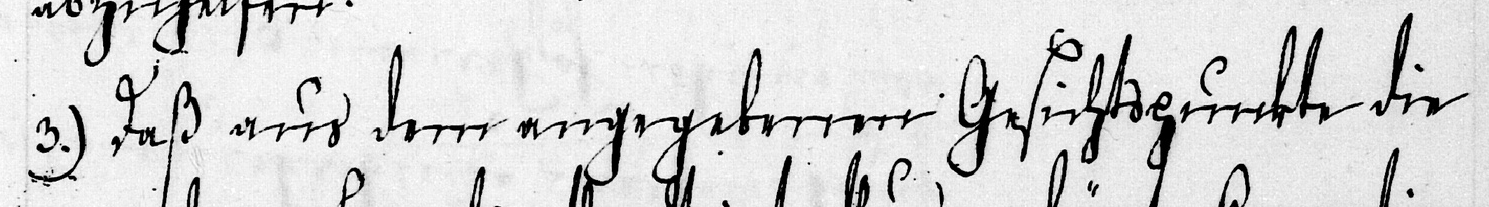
3.) Daß aus dem angegebenen Gesichtspunkte die
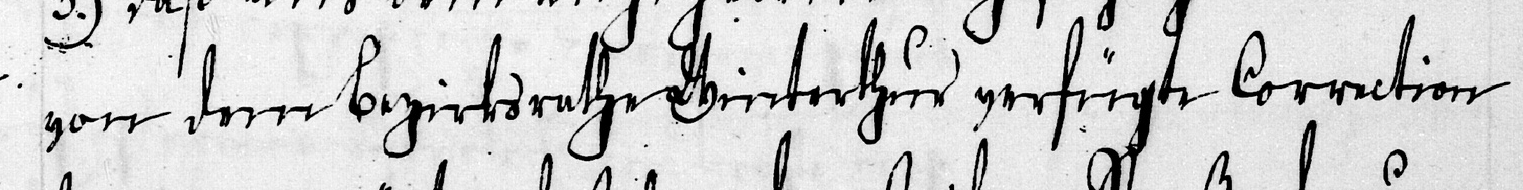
von dem Bezirksrathe Winterthur verfügte Correction
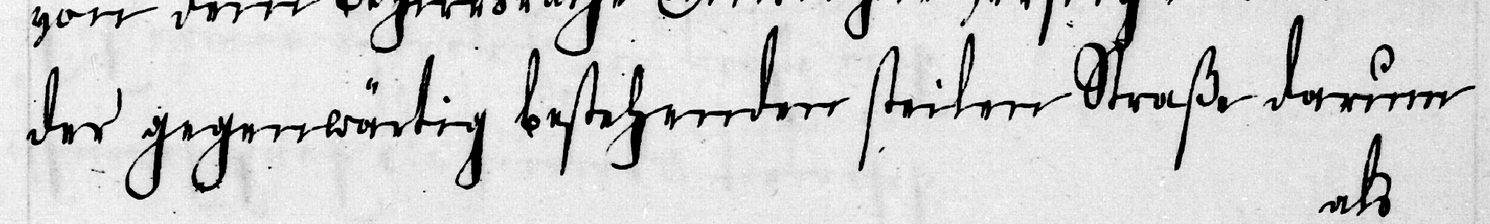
der gegenwärtig bestehenden steilen Straße darum
